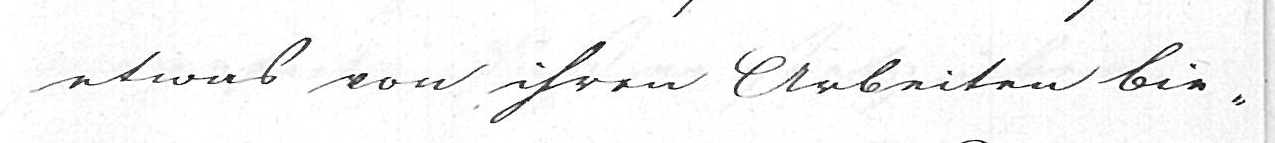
etwas von ihren Arbeiten bie-
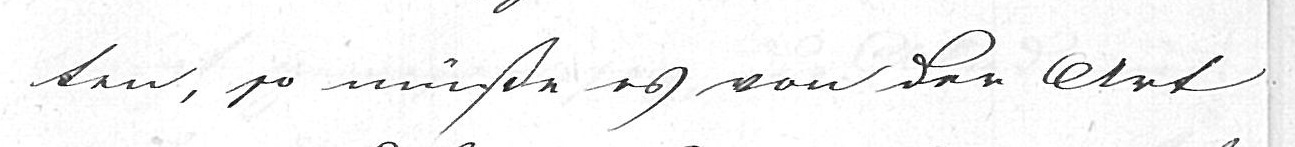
ten, so müßte es von der Art
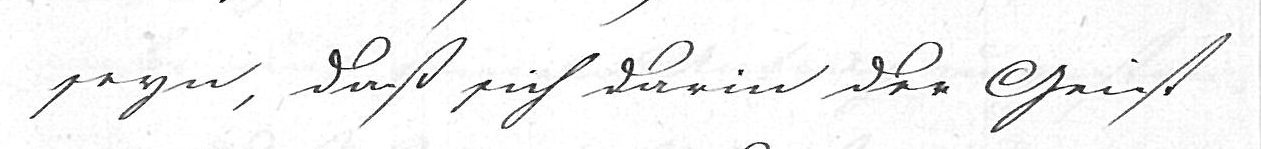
seyn, daß sich darin der Geist
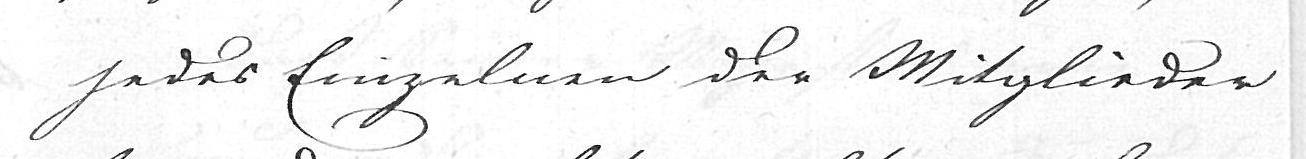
jedes Einzelnen der Mitglieder
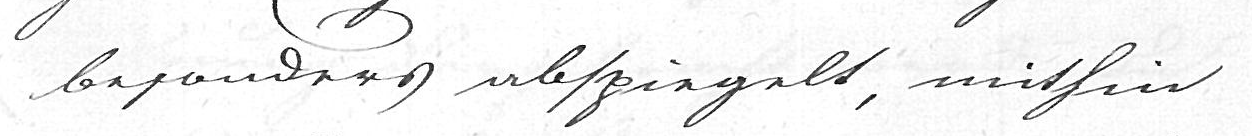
besonders abspiegelt, mithin
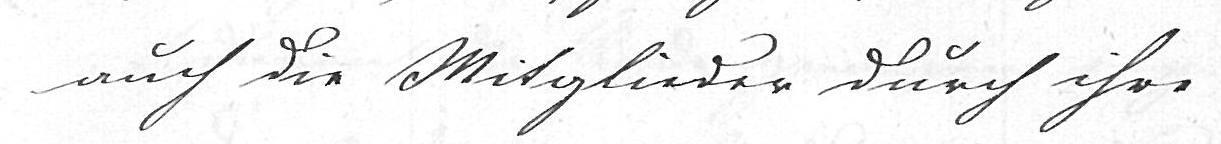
auch die Mitglieder durch ihre
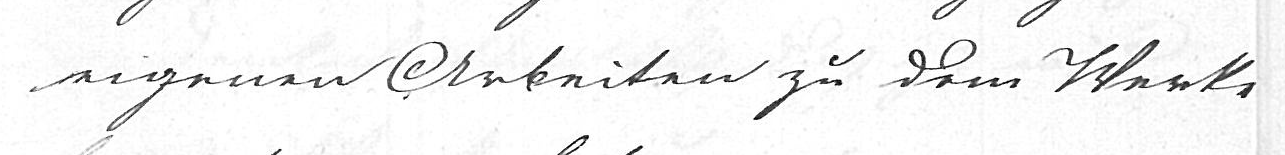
eigenen Arbeiten zu dem Werke
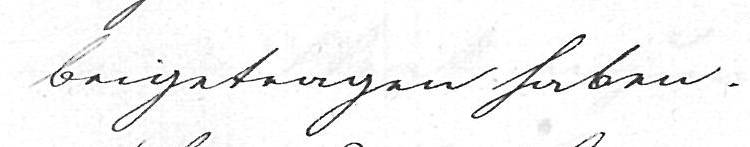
beigetragen haben.
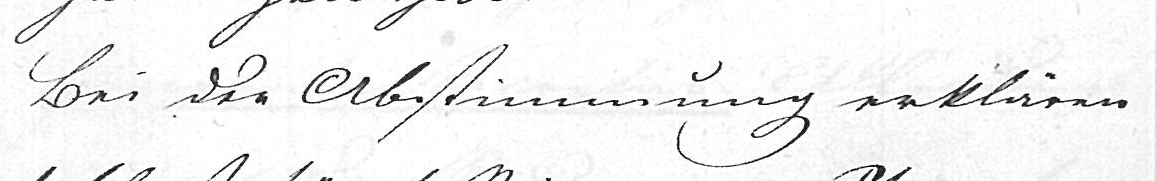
Bei die Abstimmung erklären
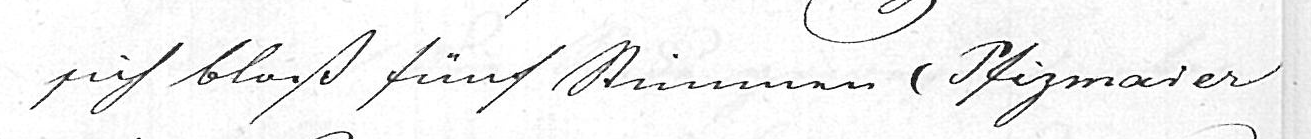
sich bloß fünf Stimmen (Pfizmaier
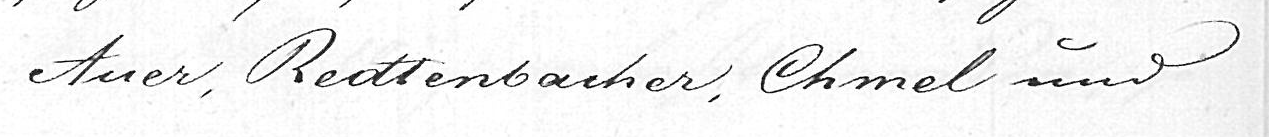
Auer, Redtenbacher, Chmel und
